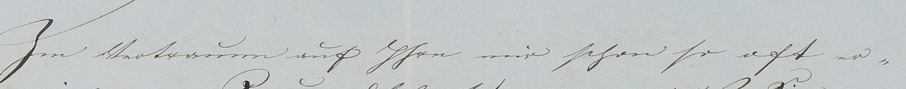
Im Vertrauen auf Ihre mir schon so oft er-
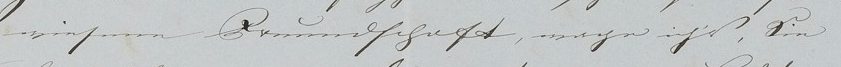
wiesene Freundschaft, wage ich's, Sie
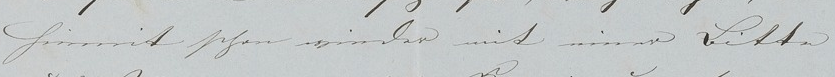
hiemit schon wieder mit einer Bitte
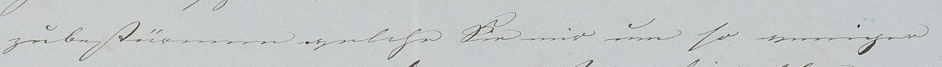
zubestürmen welche Sie mir um so weniger
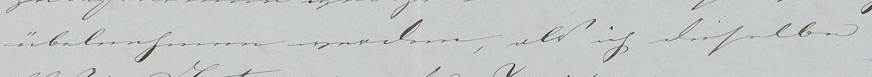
übelnehmen werden, als ich dieselbe
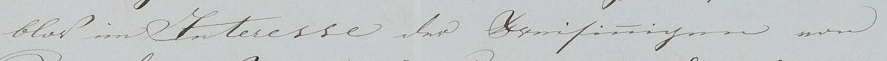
blos im Interesse der Freisinnigen von
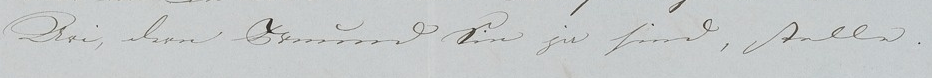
Uri, deren Freund Sie ja sind, stelle.
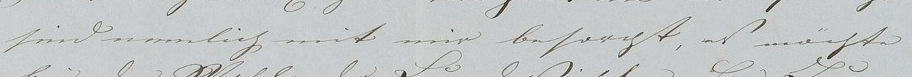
sind nemlich mit mir besorgt, es möchte
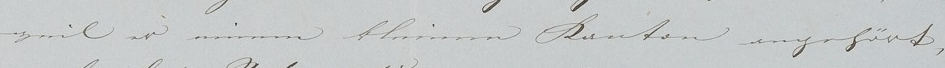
weil er einem kleinen Kanton angehört,
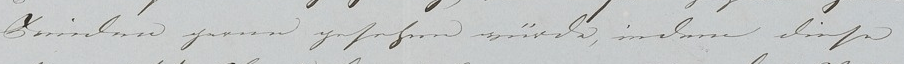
Feinden gerne gesehen würde, indem diese
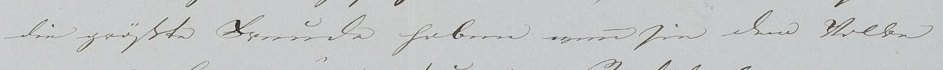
die größte Freude haben wenn sie dem Volke
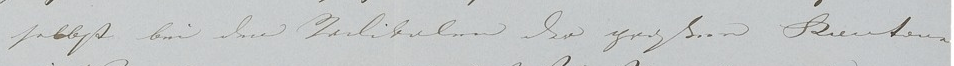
selbst bei den Radikalen der großen Kantone
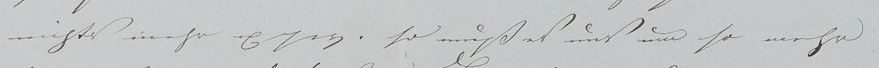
nichts mehr» &s. w. so muß es uns um so mehr
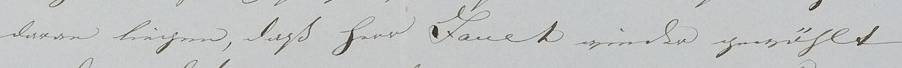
daran liegen, daß Herr Jauch wieder gewählt
